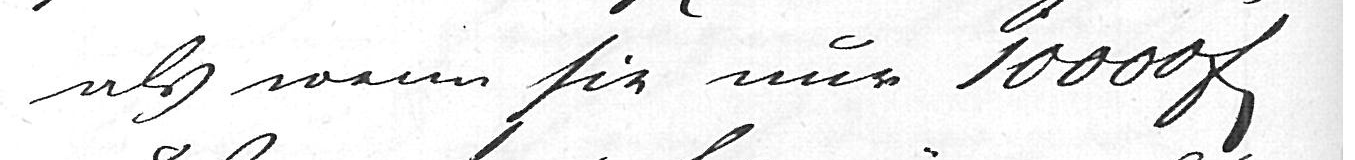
als wenn sie nur 10000 fr
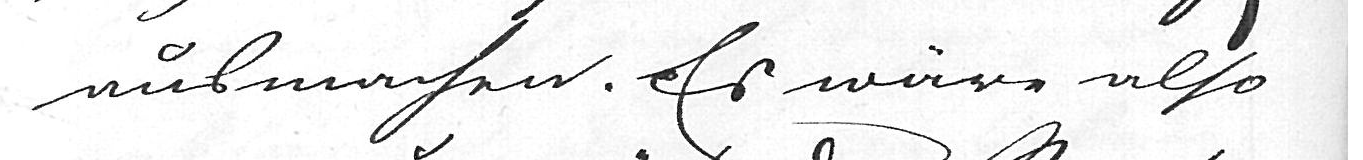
ausmachen. Es wäre also
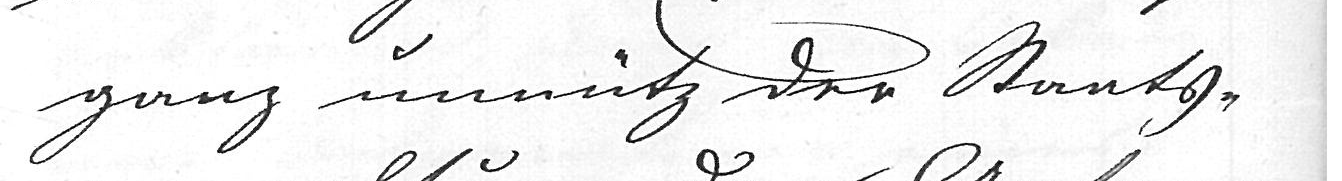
ganz unnütz der Staats-
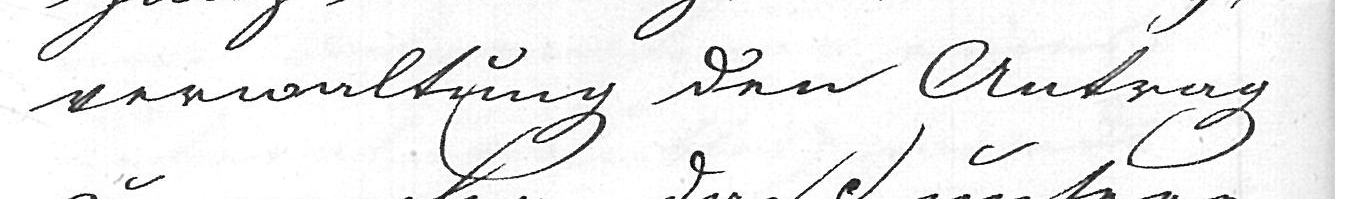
verwaltung den Antrag
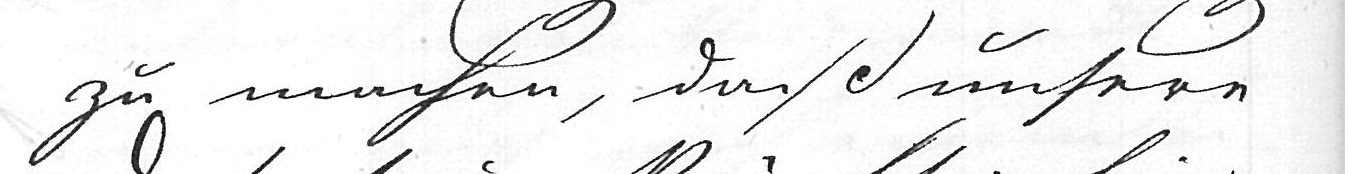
zu machen, daß unsere
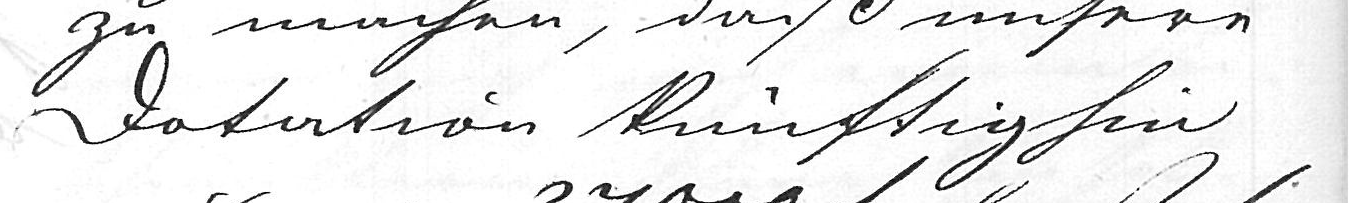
Dotation künftighin
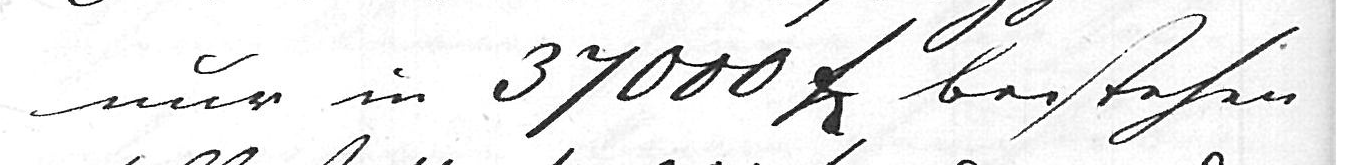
nur in 37000 fl bestehen
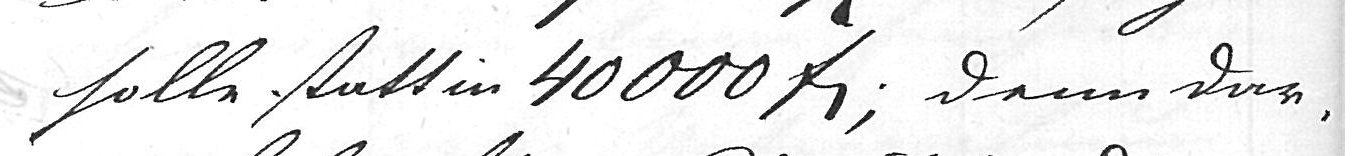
solle statt 40000 fl; denn dar-
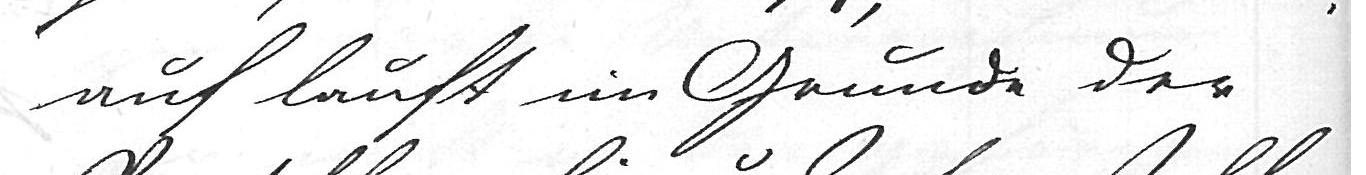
auf läuft in Grunde der
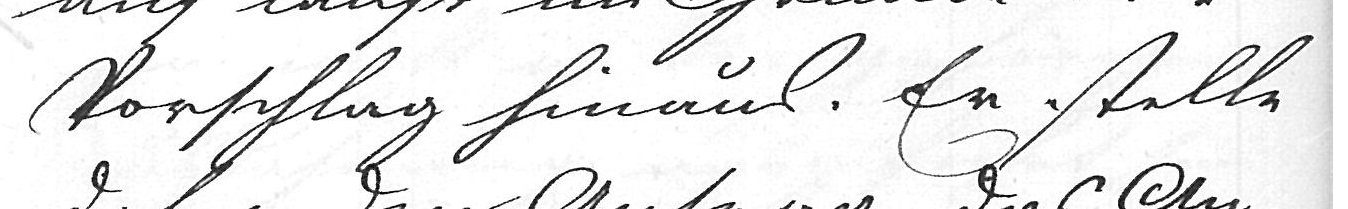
Vorschlag hinaus. Er stelle
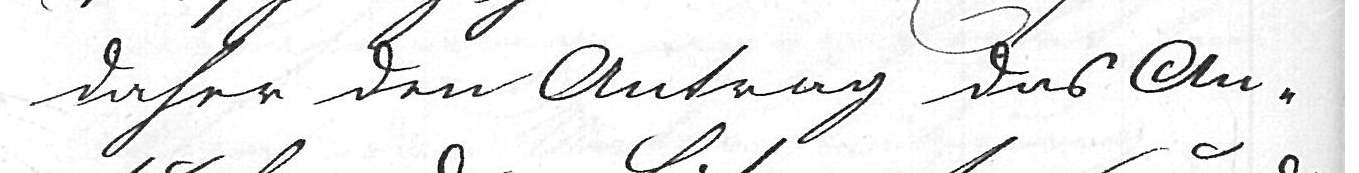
daher den Antrag das An-
